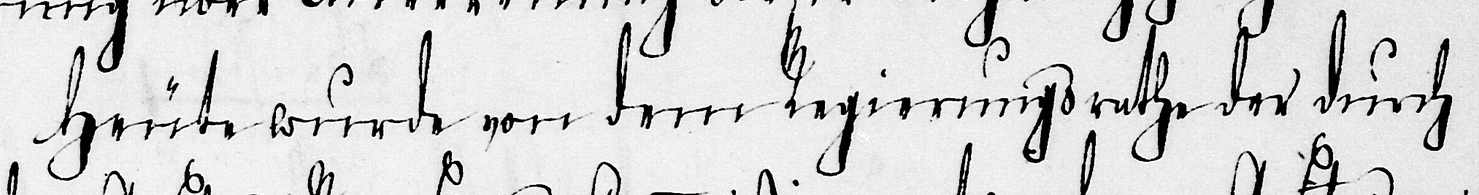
Heute wurde von dem Regierungsrathe der durch
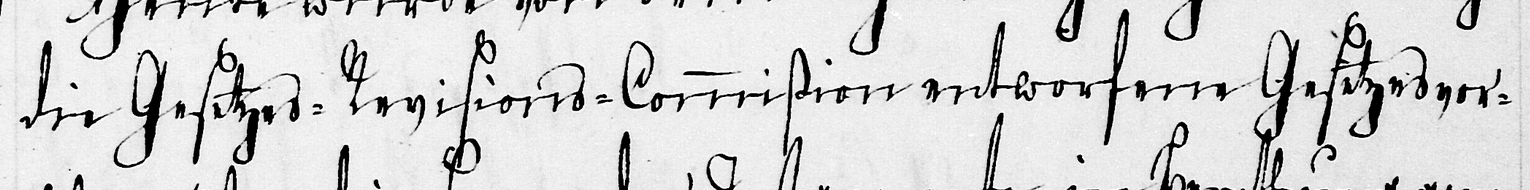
die Gesetzes-Revisions-Commißion entworfene Gesetzesvor¬
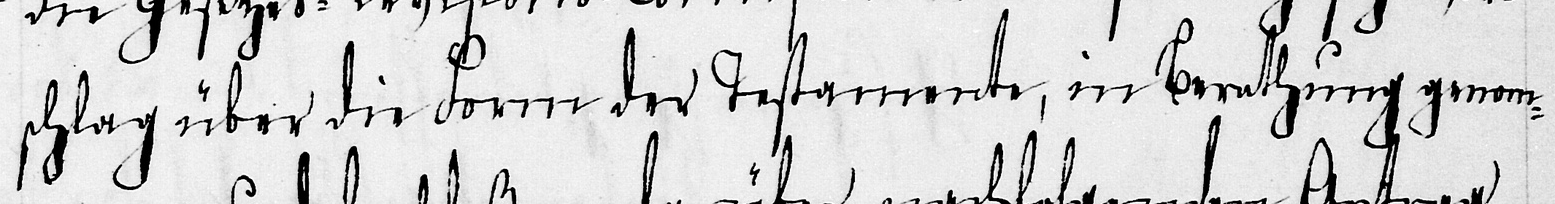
schlag über die Form der Testamente, in Berathung genom¬
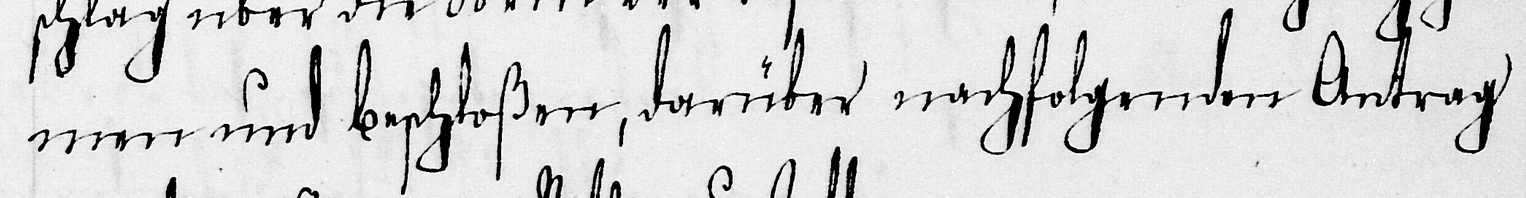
men und beschloßen, darüber nachfolgenden Antrag
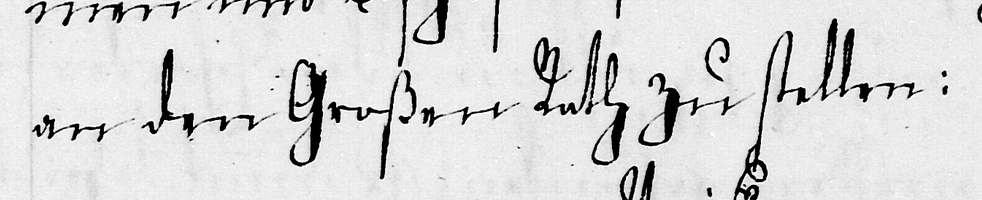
an den Großen Rath zu stellen:
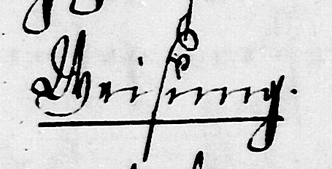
Weisung:
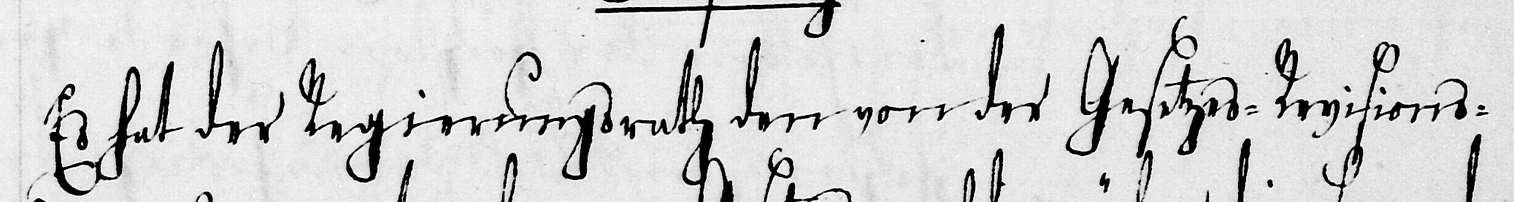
Es hat der Regierungsrath den von der Gesetzes-Revision¬
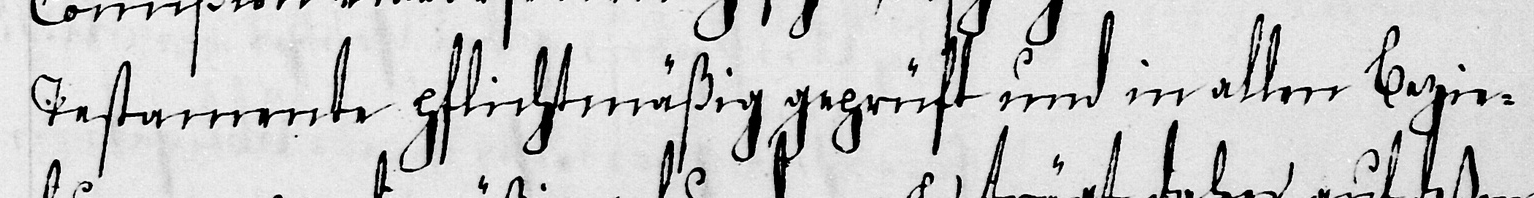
Testamente pflichtmäßig geprüft und in allen Bezie¬
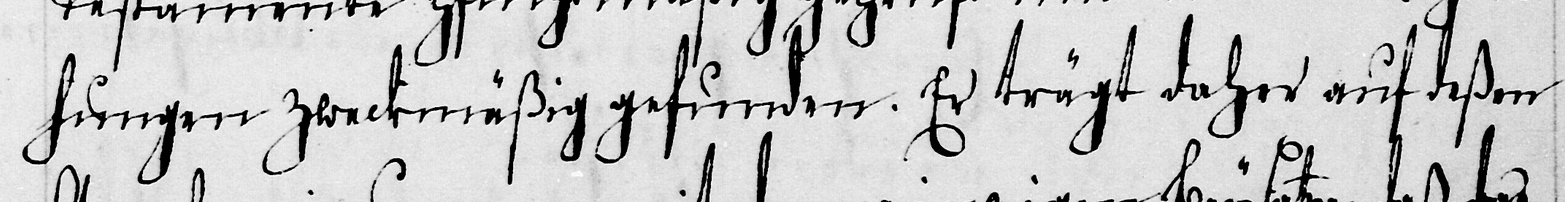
hungen zweckmäßig gefunden. Er trägt daher auf deßen
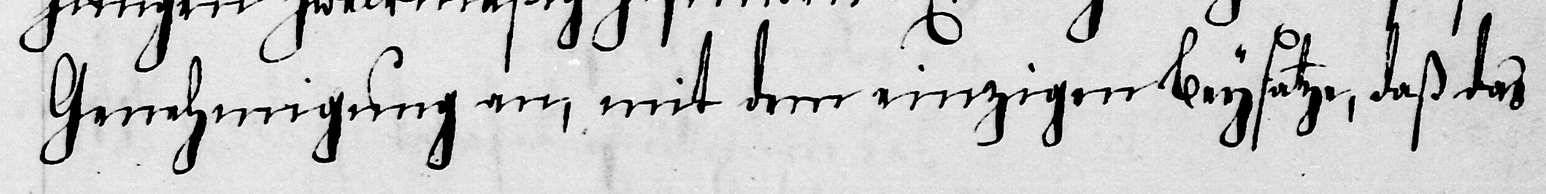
Genehmigung an, mit dem einzigen Beysatze, daß das
